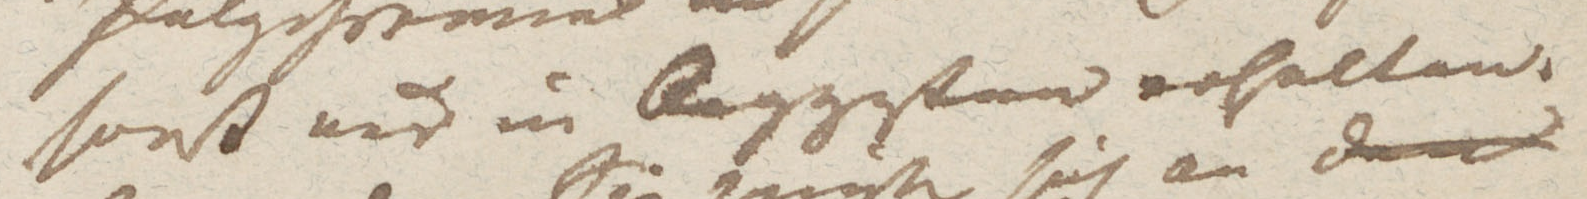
sonst nur in Aegypten erhalten.
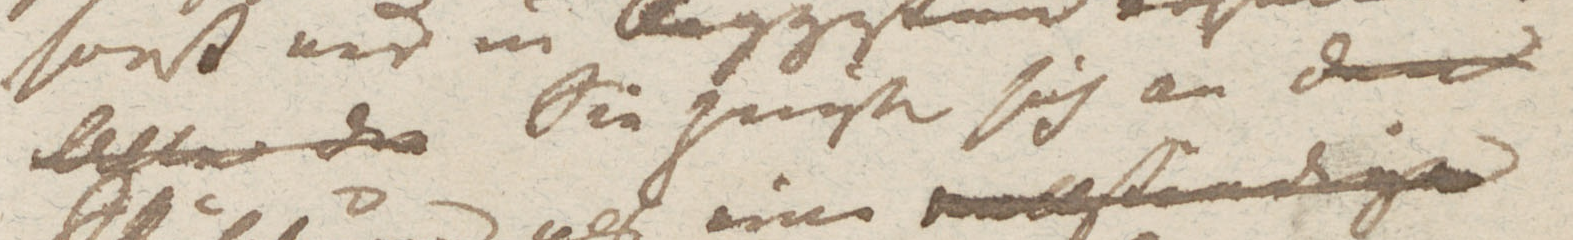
Alle die Sie zeigt sich an den
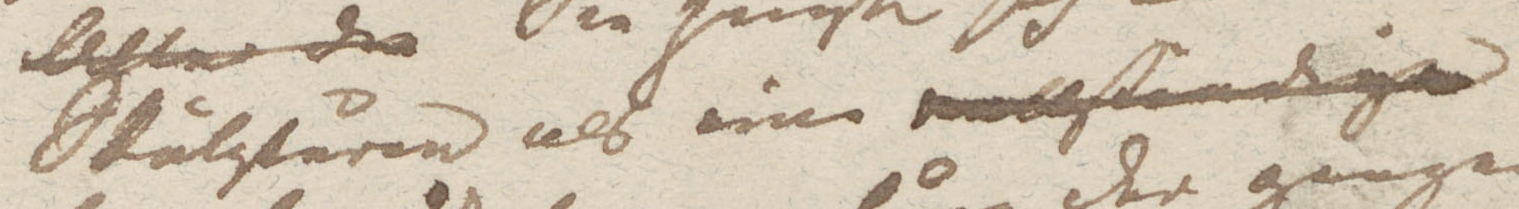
Skulpturen als eine vollständige
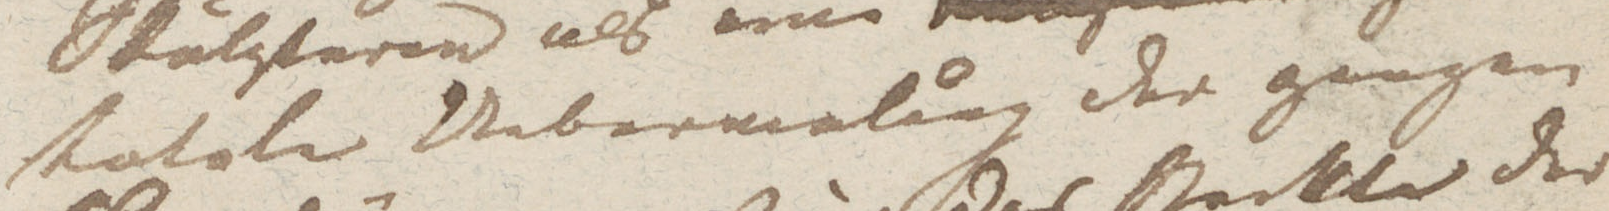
totale Uebermalugn der ganzen
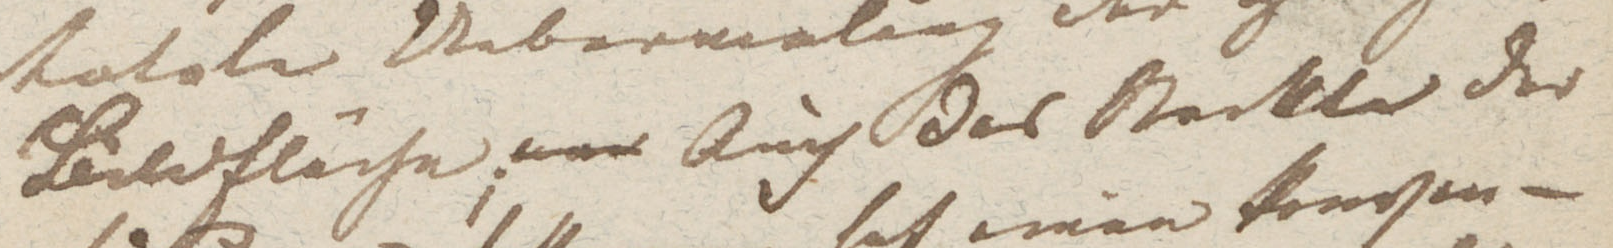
Bildfläche; Auch das Nackte der
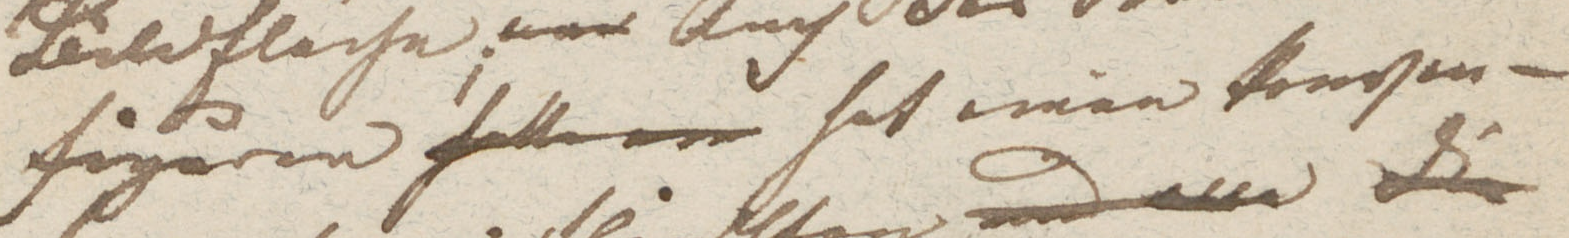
Figuren hatte hat einen koven-
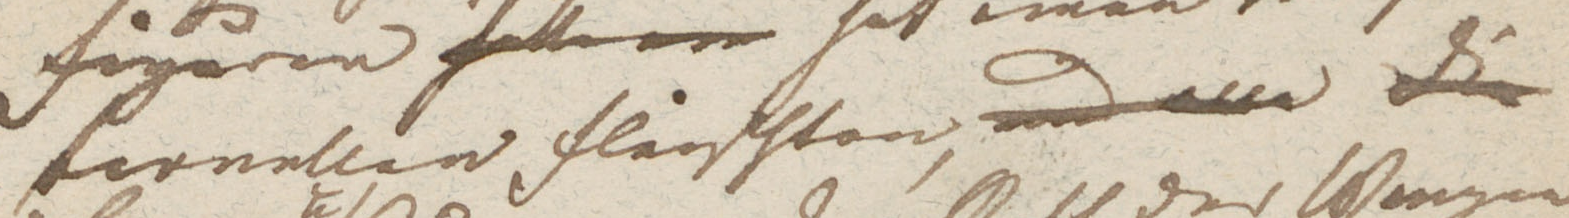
tionellen Fleischton, und alle die
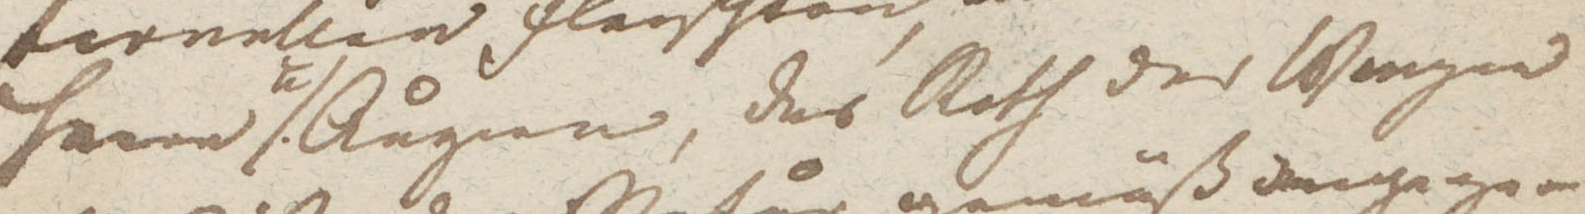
Haare u. Augen, das Roth der Wangen
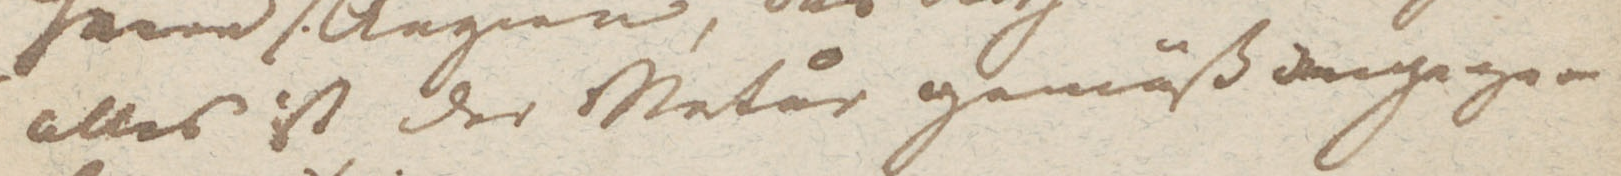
alles ist der Natur gemäss dargege-
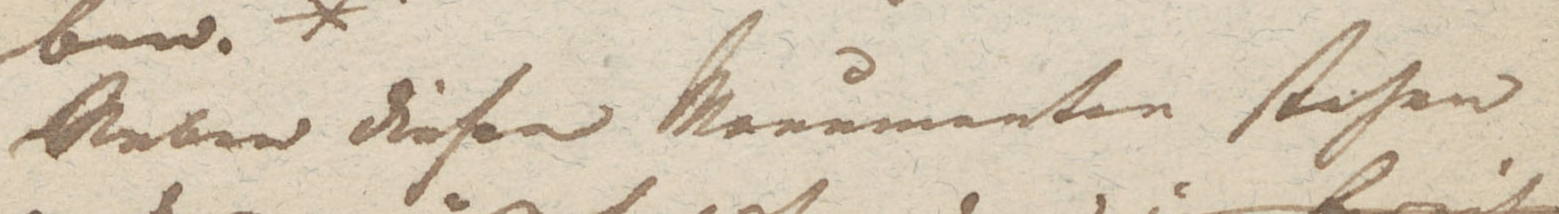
Neben diesen Monumenten stehen
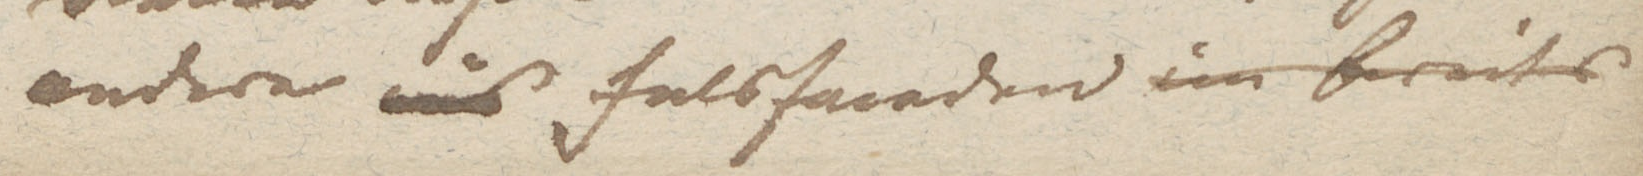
andere aus Felsfacaden im bereits
